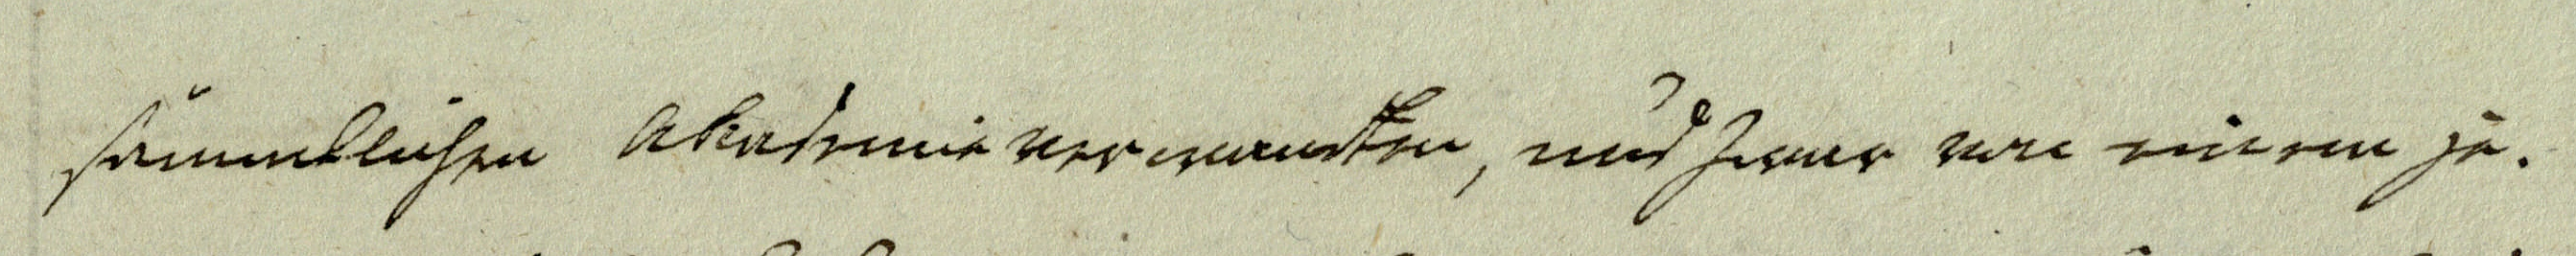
sämmtlichen Akademieverwandten, und zwar von einem je¬
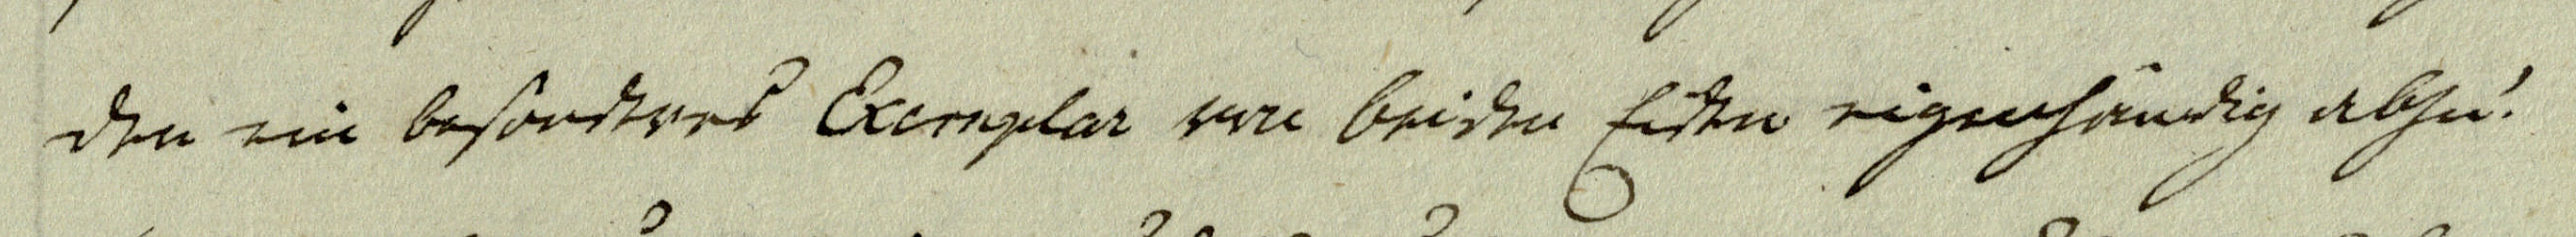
den ein besonderes Exemplar von beiden Eiden eigenhändig abzu¬
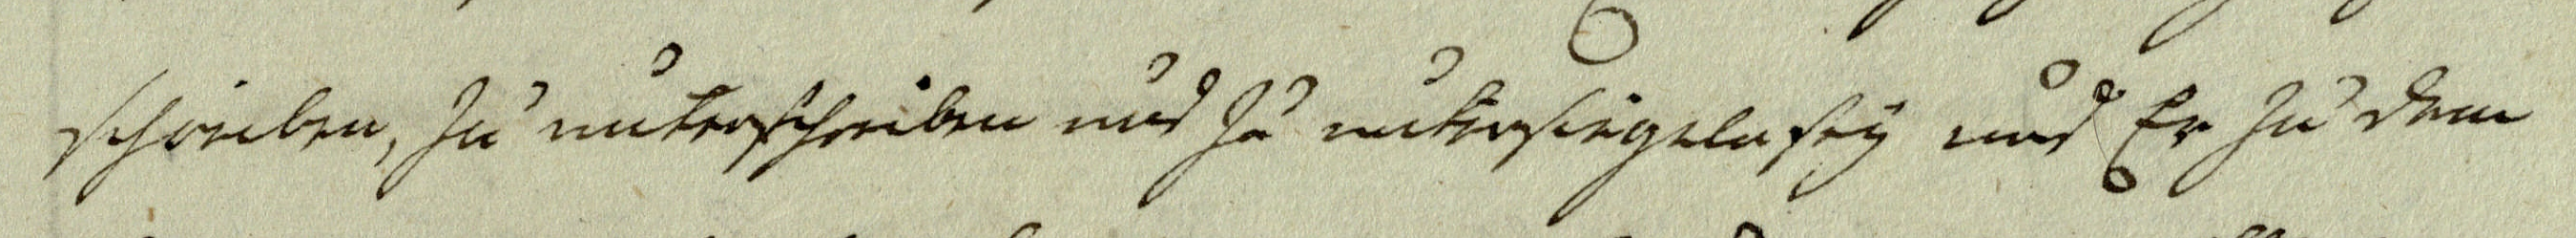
schreiben, zu unterschreiben und zu untersiegeln seÿ und Er zu dem
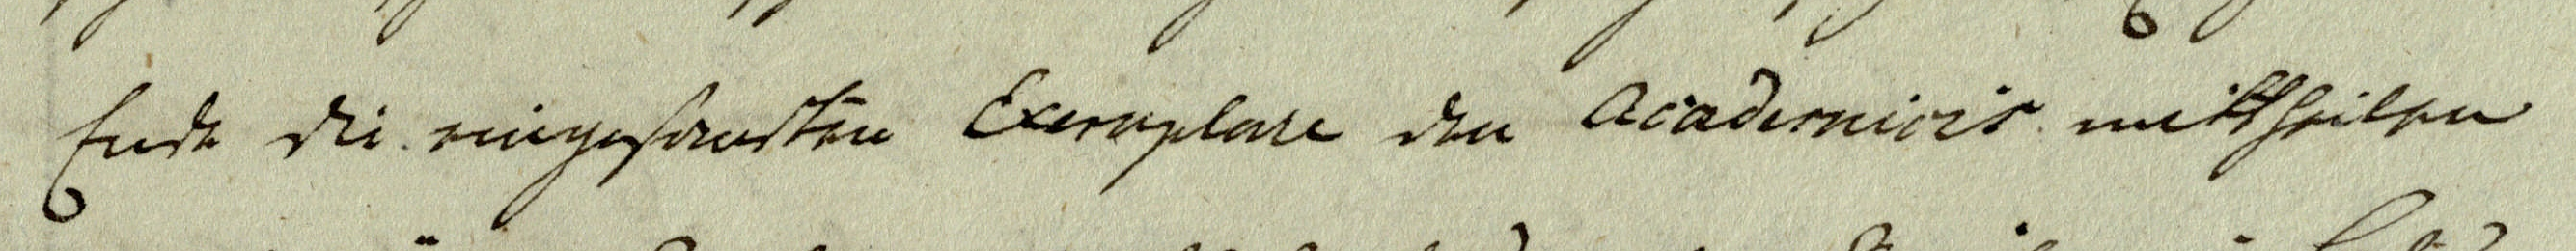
Ende die eingesandten Exemplare den Academicis mittheilen
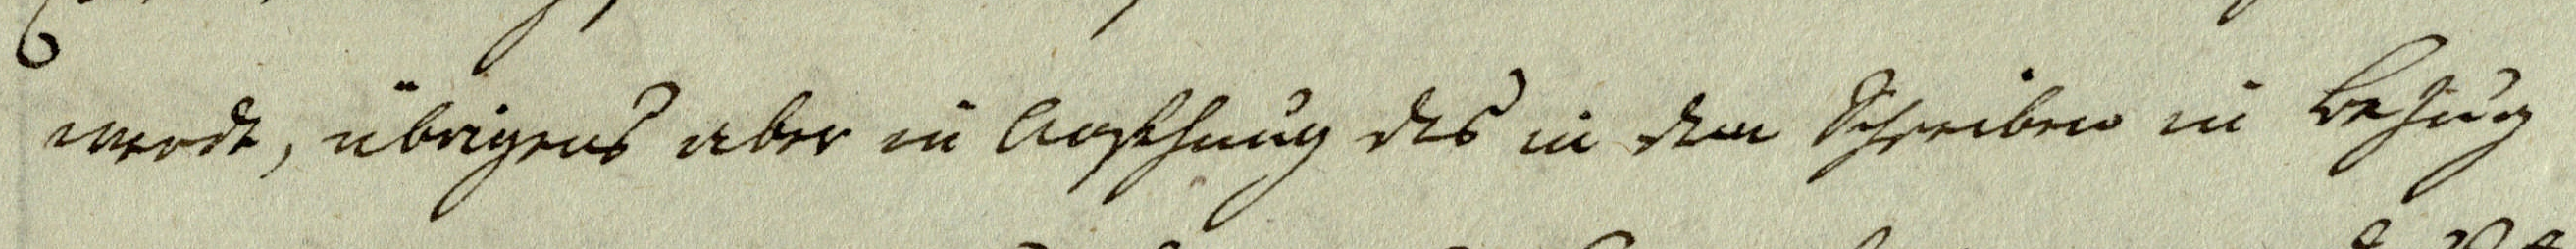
werde, übrigens aber in Ansehung des in dem Schreiben in Bezug
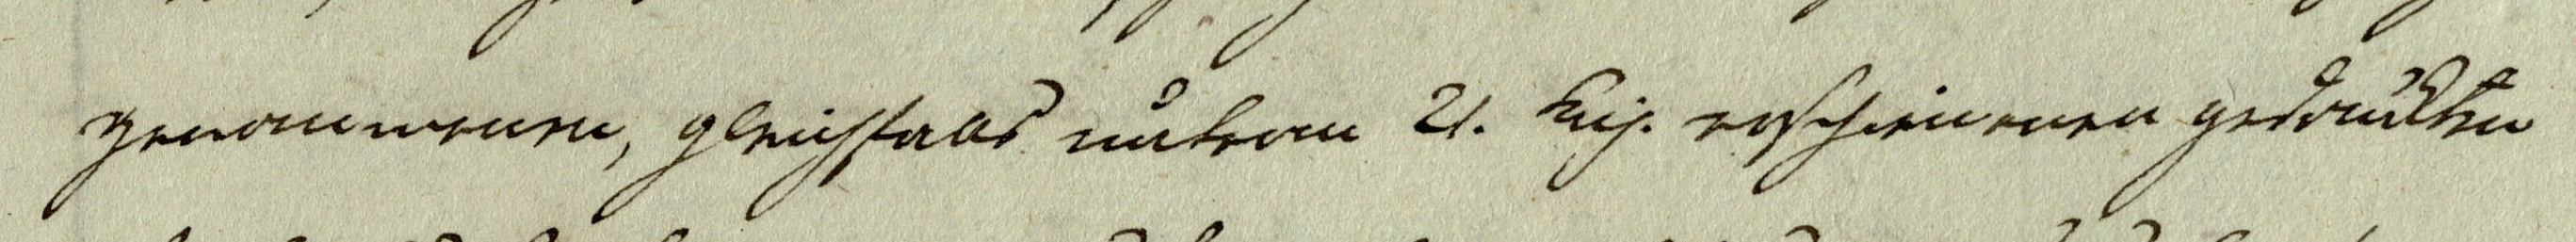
genommenen, gleichfalls unterm 21. huj. erschienenen gedruckten
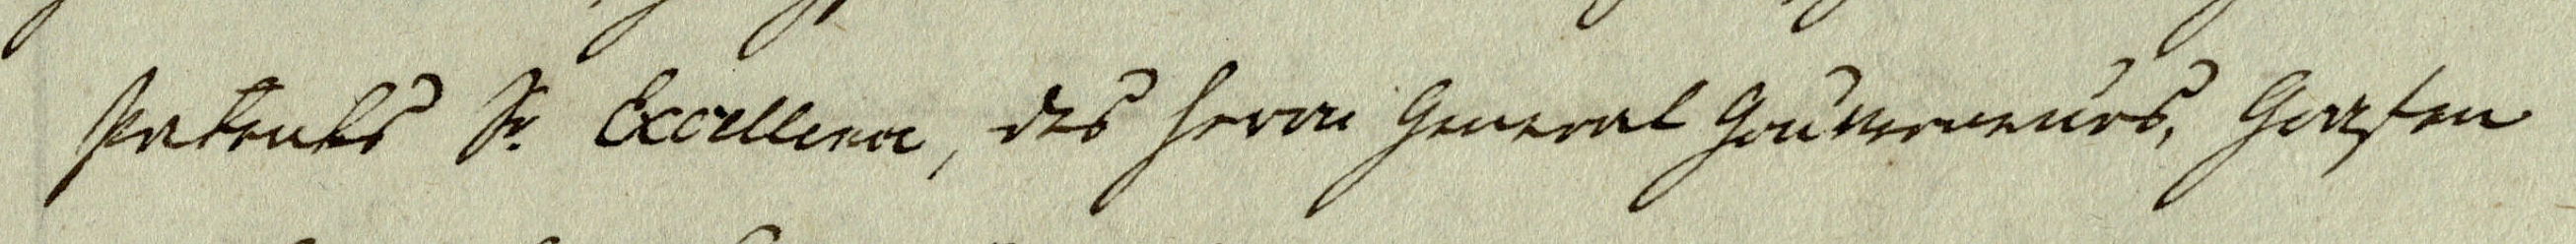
Patents Sr Excellence, des Herrn General Gouverneurs, Grafen
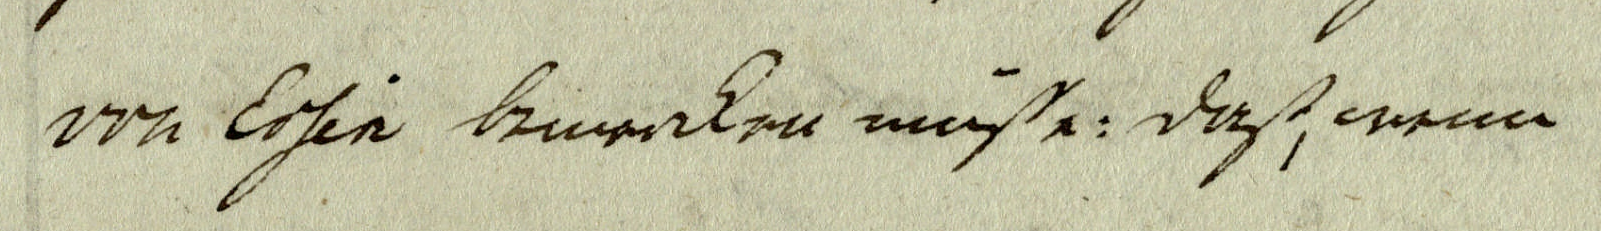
von Essen bemercken müsse: daß, wenn
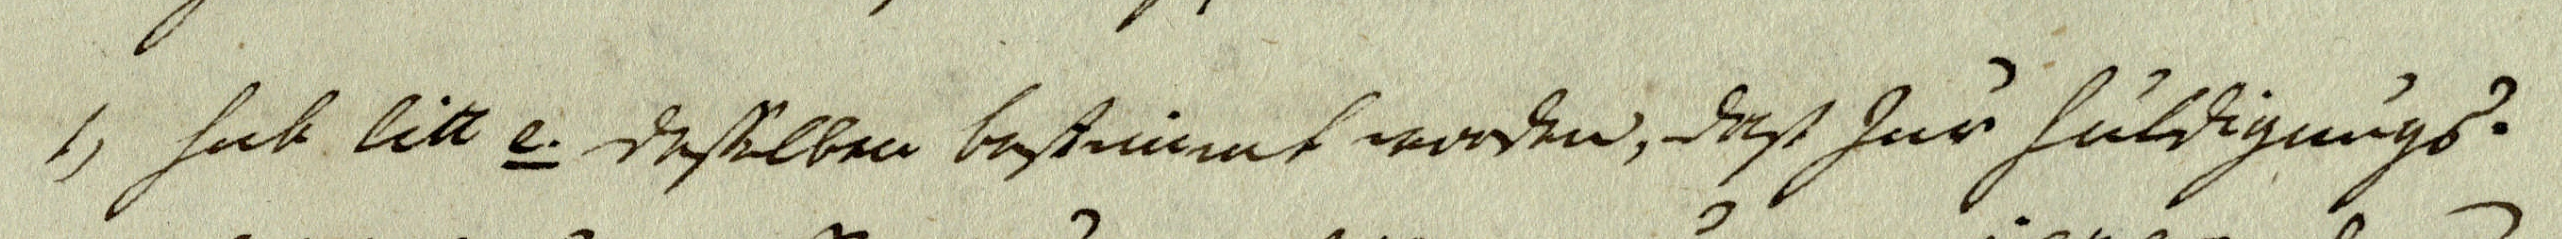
1, sub litt a. desselben bestimmt worden, daß zur Huldigungs¬
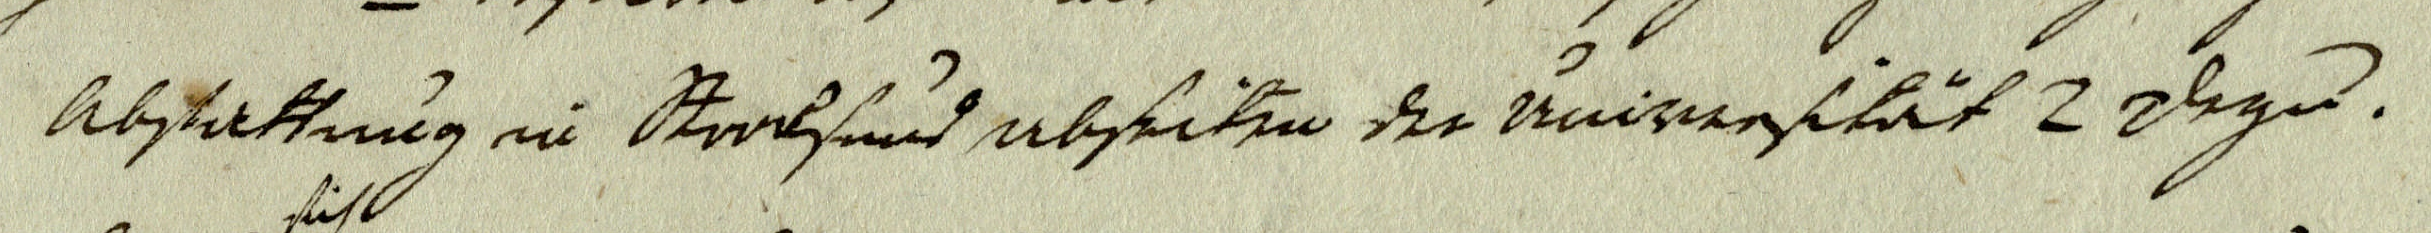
Abstattung in Stralsund abseiten der Universität 2 dDepu¬
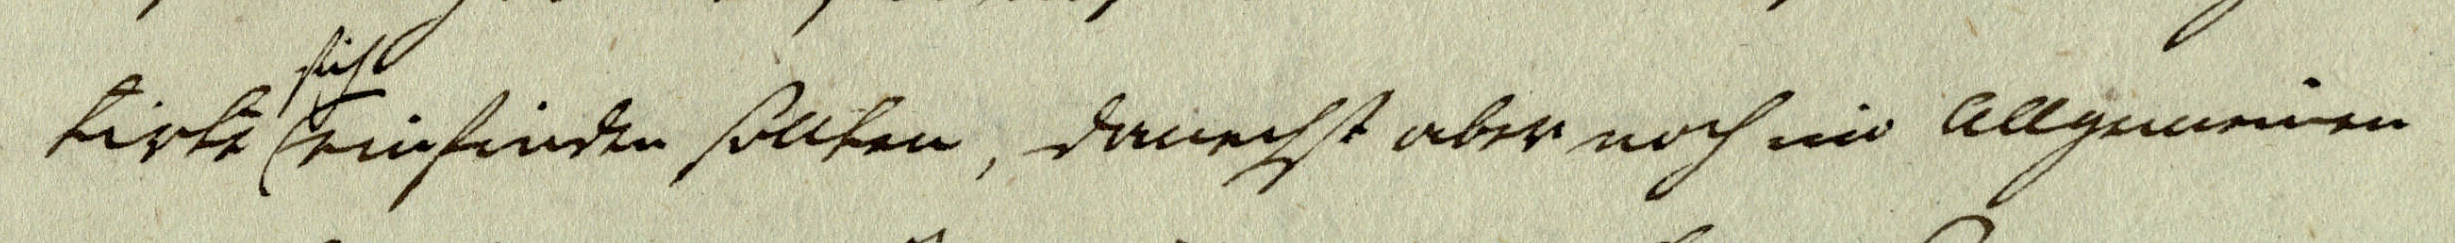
tirte sich einfinden sollten, danechst aber noch im Allgemeinen
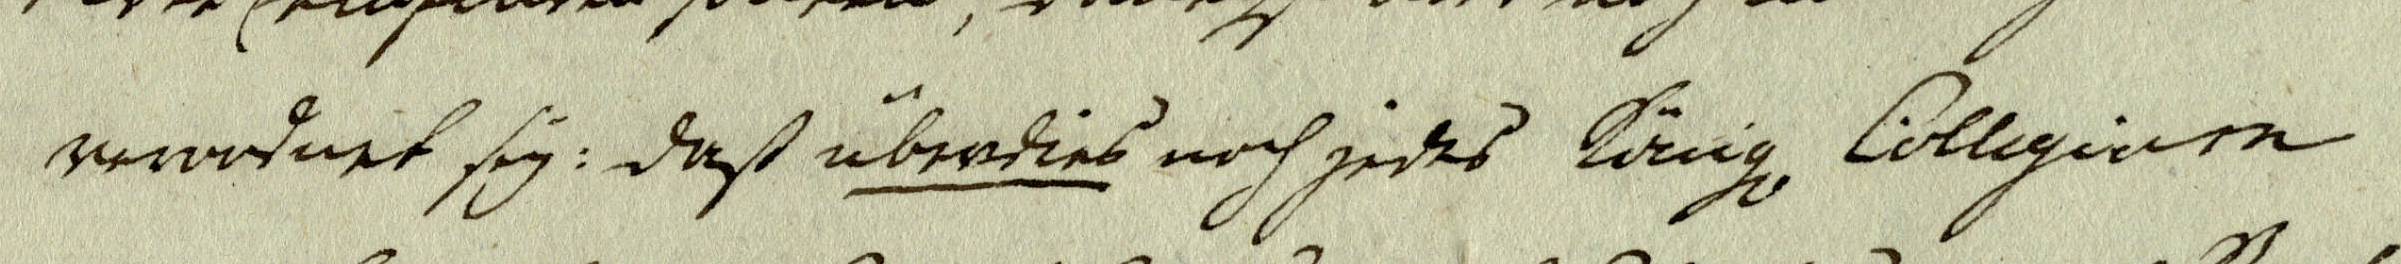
verordnet seÿ, daß überdies noch jedes Königl. Collegium
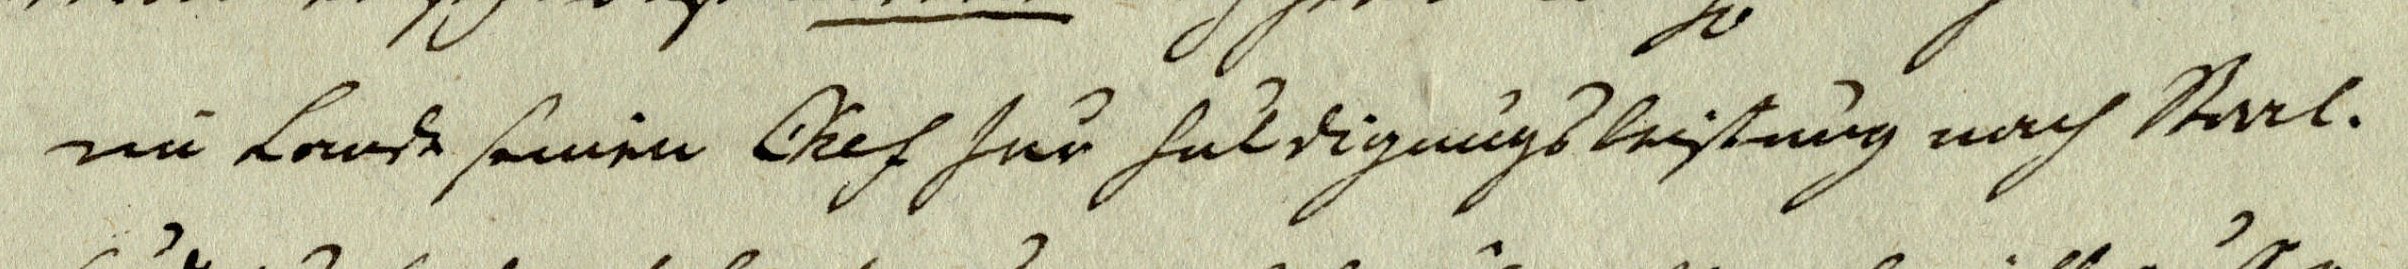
im Lande seinen Chef zur Huldigungsleistung nach Stral¬
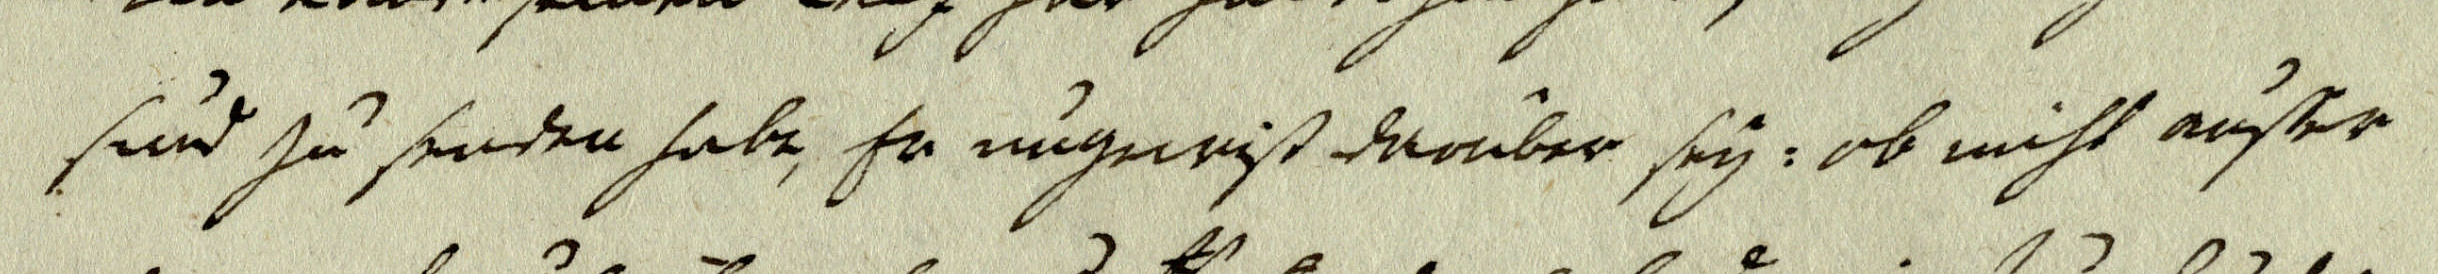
sund zu senden habe, Er ungewiß darüber seÿ: ob nicht ausser
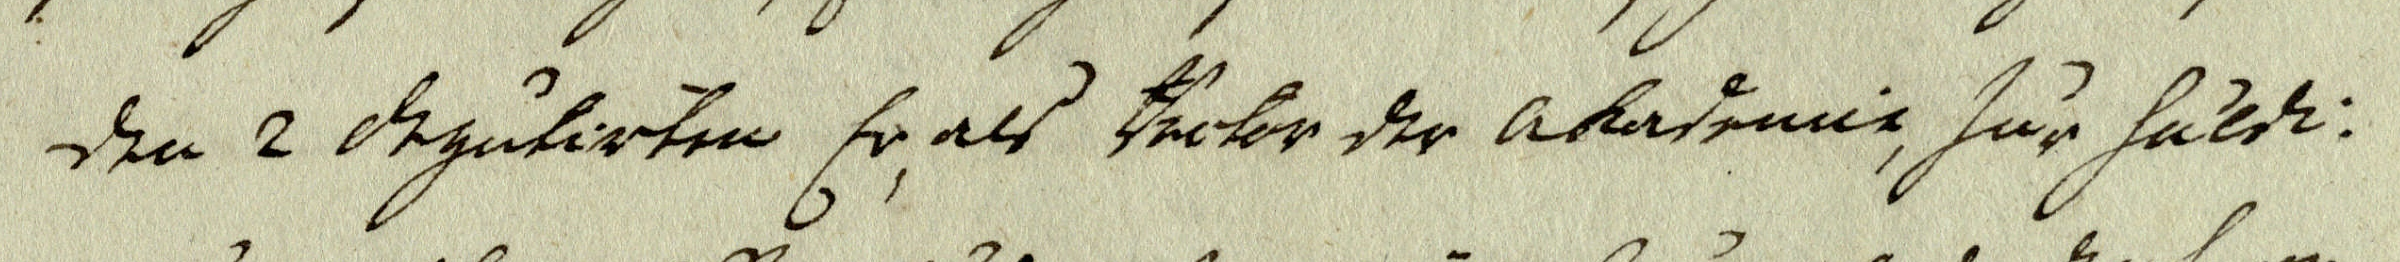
den 2 Deputirten Er, als Rector der Akademie, zur Huldi¬
